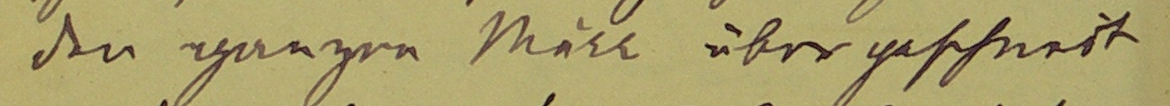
den ganzen März über geschneit
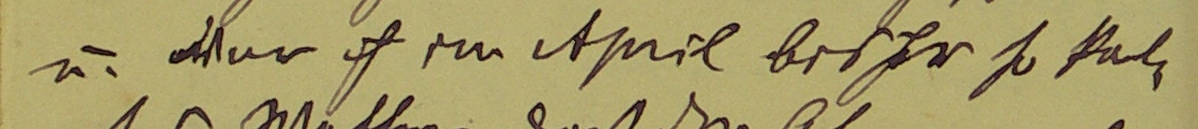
und war auch im April bisher so kal¬
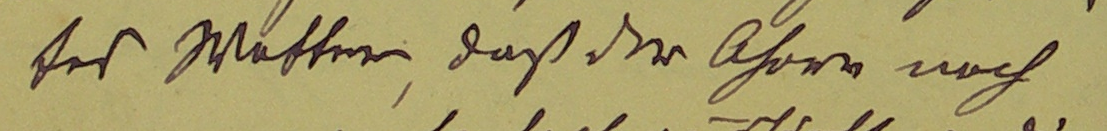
tes Wetter, daß der Ahorn noch
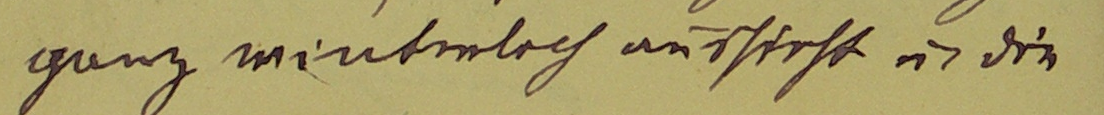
ganz winterlich aussieht und die
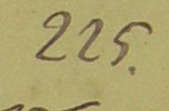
225
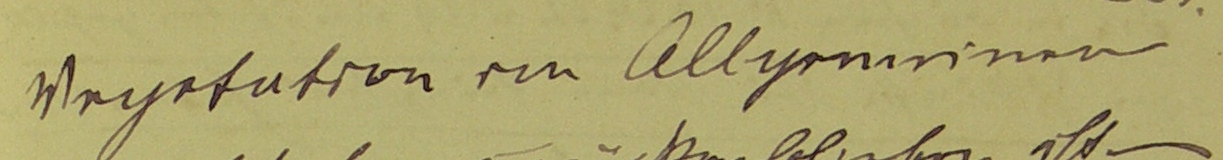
Vegetation im Allgemeinen
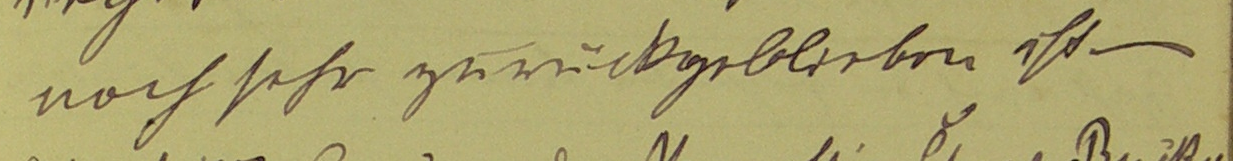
noch sehr zurückgeblieben ist.
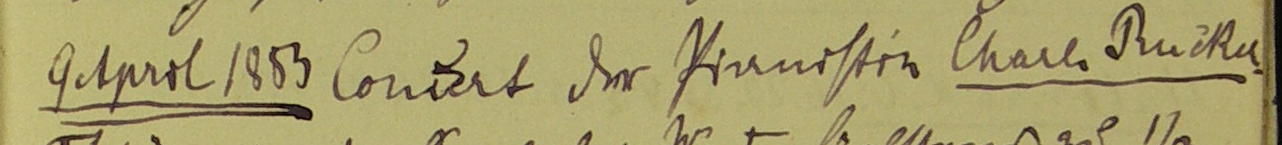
9. April 1883 Concert der Pianistin Charen Rucker
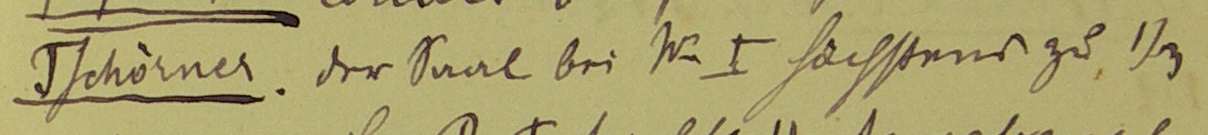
Tschörnes. Der Saal bei Wa I höchstens zu 1/3
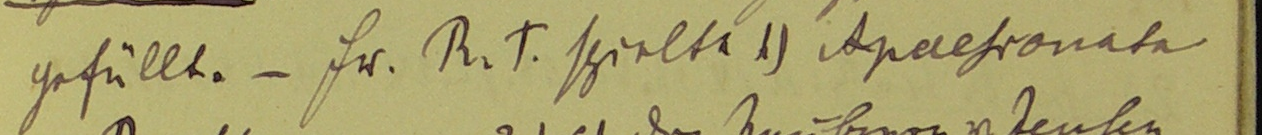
gefüllt.- Fr. R.T spielte 1) Apaesonate
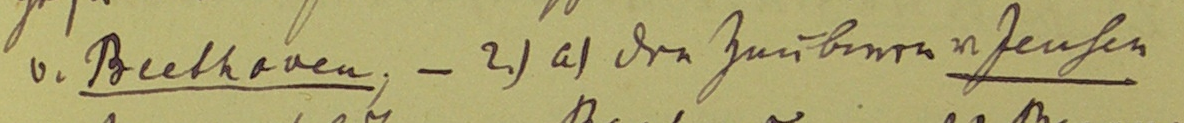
von Beethoven. 2) a) der Zauberer von Jensen,
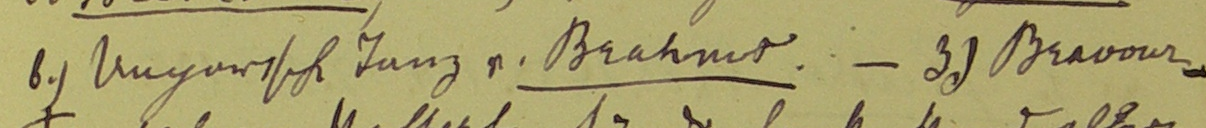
b) Ungarischer Tanz von Brahms.- 3 Bravour-
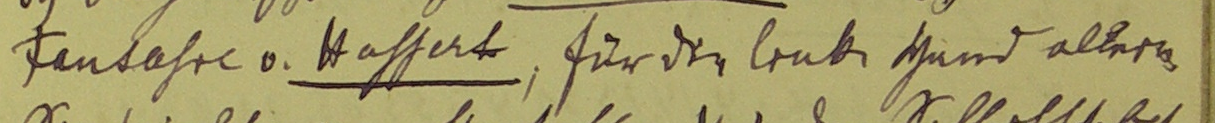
Fantasie von Hassert; für die linke Hand allein.-
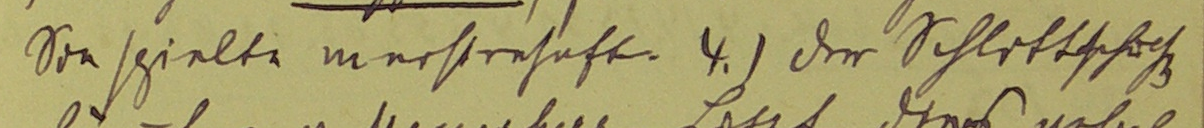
Sie spielte meisterhaft.- 4) Der Schlittschuh¬
